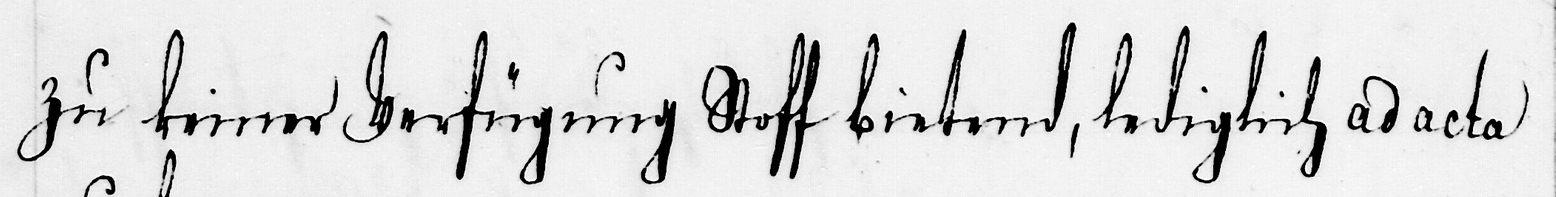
zu keiner Verfügung Stoff bietend, lediglich ad acta
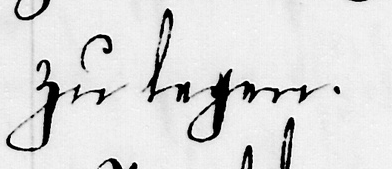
zu legen.
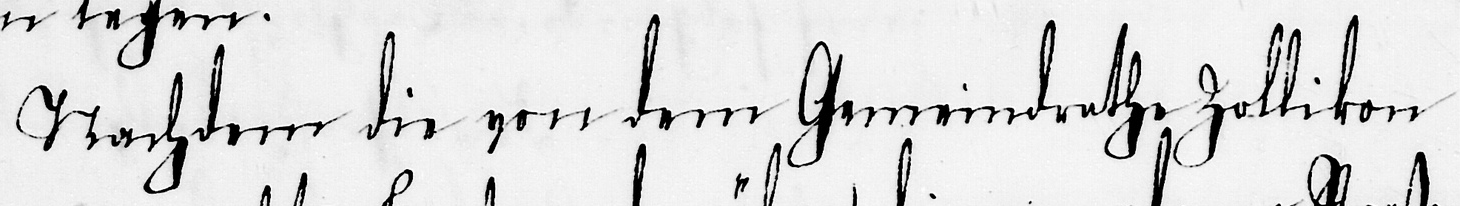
Nachdem die von dem Gemeindrathe Zollikon
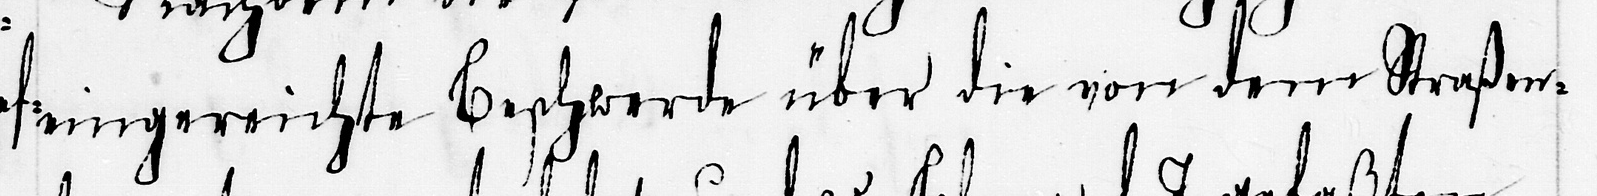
eingereichte Beschwerde über die von dem Straßen¬
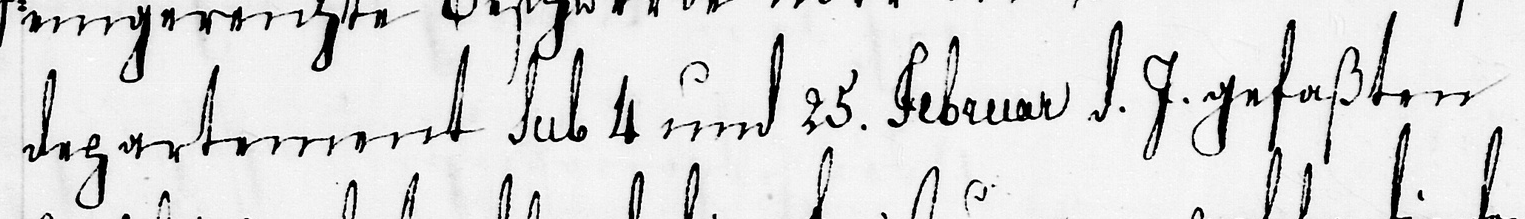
departement sub 4 und 25. Februar d. J. gefaßten
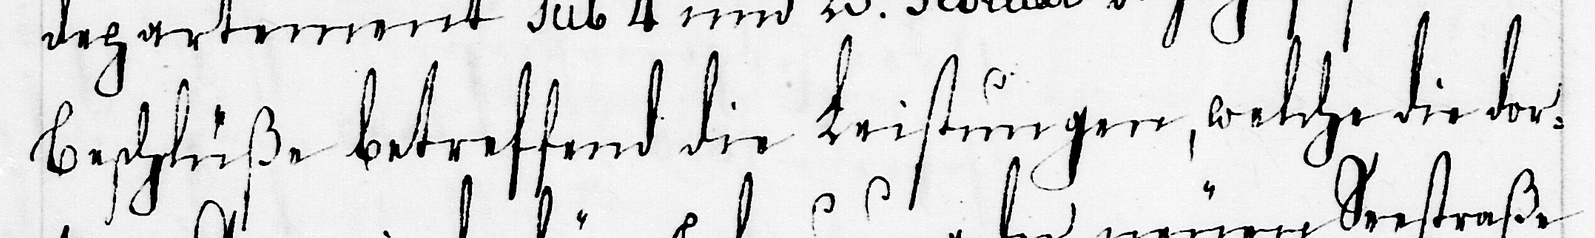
Beschlüße betreffend die Leistungen, welche die do¬
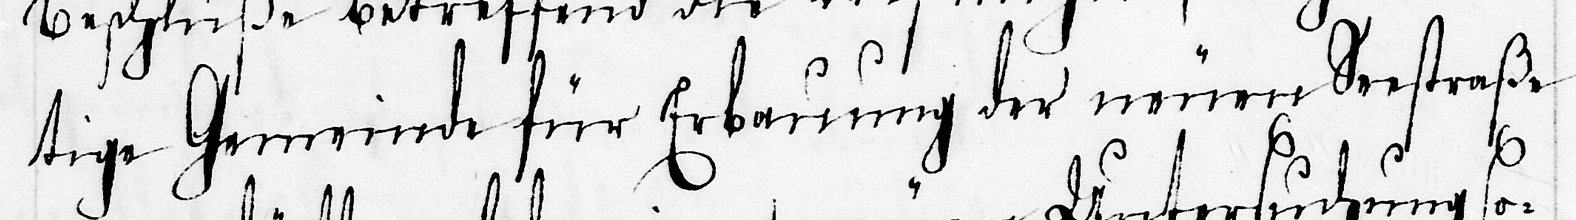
rtige Gemeinde für Erbauung der neuen Seestraße
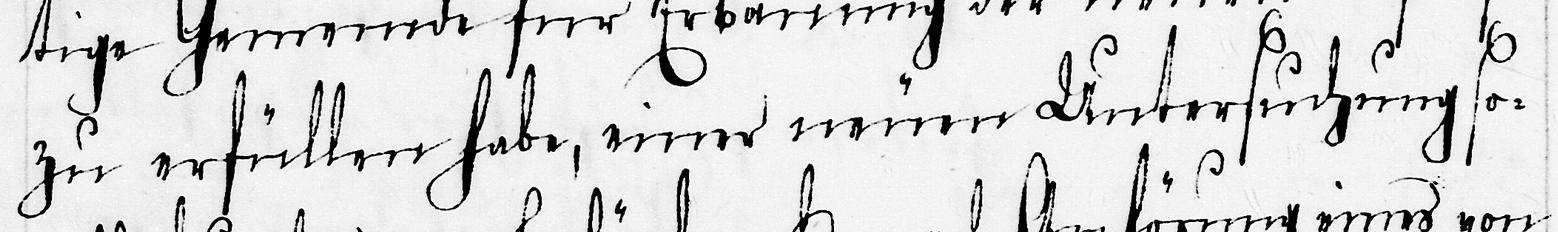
zu erfüllen habe, einer neuen Untersuchung so¬
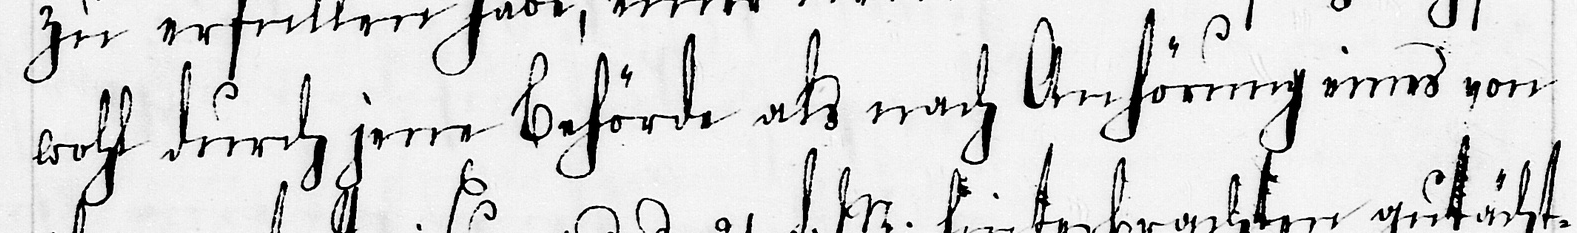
wohl durch jene Behörde als nach Anhörung eines von
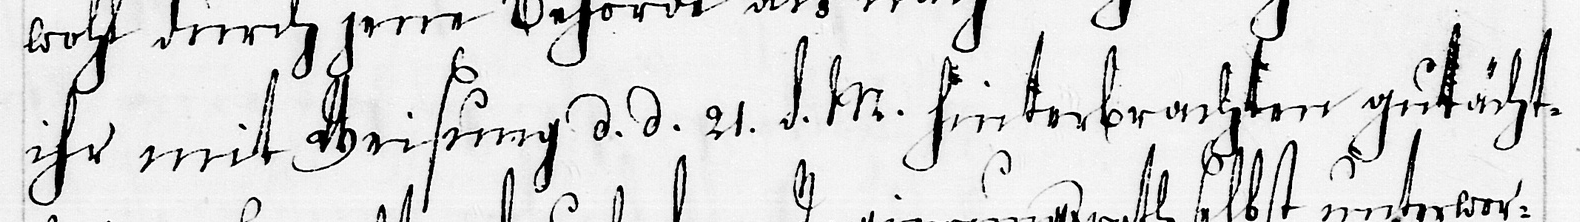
ihr mit Weisung d. d. 21. d. M. hinterbrachten gutächt¬
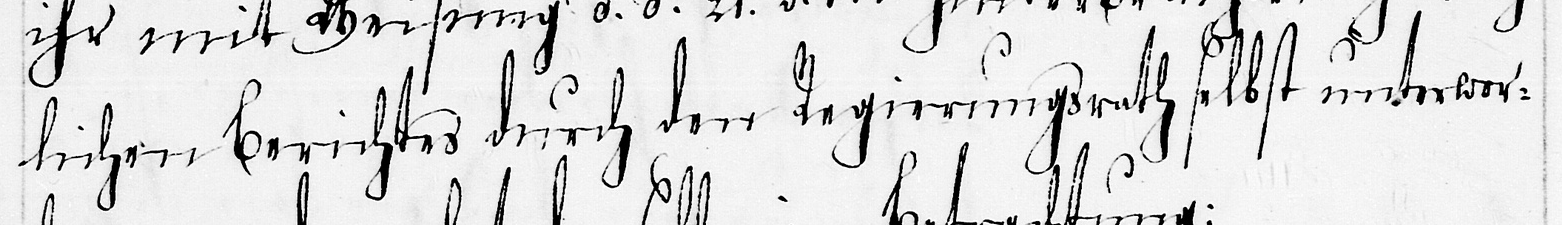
lichen Berichtes durch den Regierungsrath selbst unterwor¬
